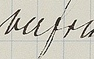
verfrüht.
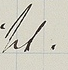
habe
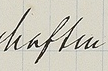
bestimmten
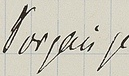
Berlin u
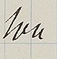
sich
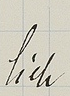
über
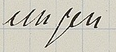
unterrichten;
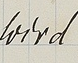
es wird
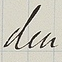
dabei
